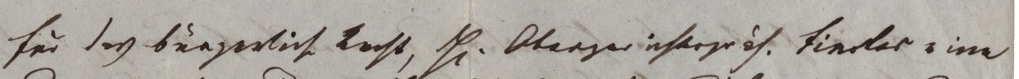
für das bürgerliche Recht, H. Obergerichtspräs. Finsler eine
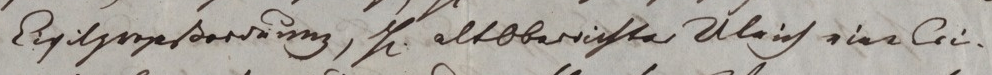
Civilprozeßordnung, H. alt Oberrichter Ulrich eine Cri-
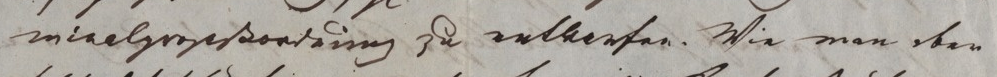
minalprozeßordnung zu entwerfen. Wie man aber
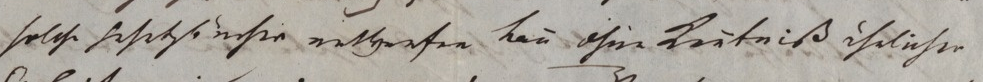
solche Gesetzbücher entwerfen kann ohne Kenntniß ähnlicher
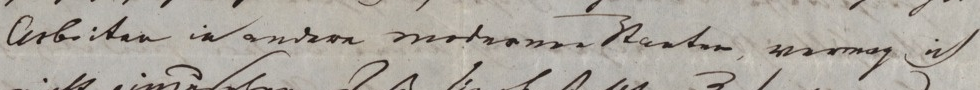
Arbeiten in andern modernen Staaten, vermag ich
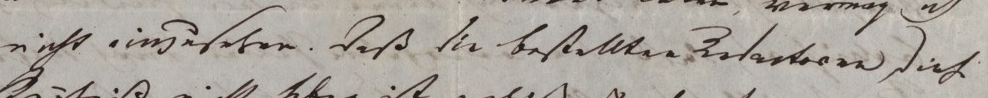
nicht einzusehen. Daß die bestellten Redactoren diese
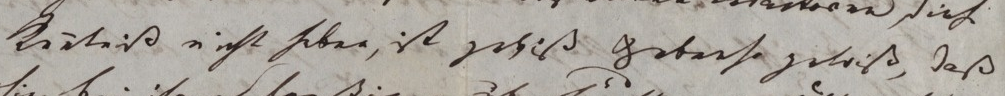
Kenntniß nicht haben, ist gewiß & ebenso gewiß, daß
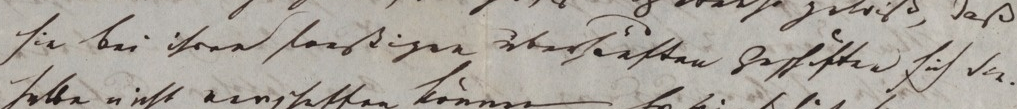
sie bei ihren sonstigen überhäuften Geschäften sich die-
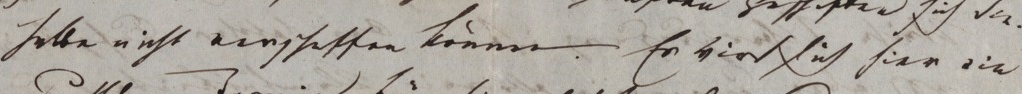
selbe nicht verschaffen können. Es wird sich hier ein
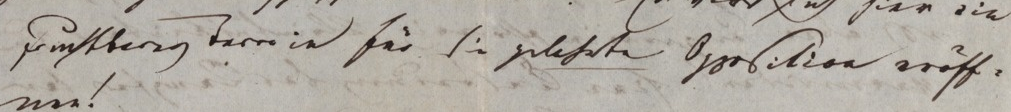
fruchtbares Terrain für die gelehrte Opposition eröff-
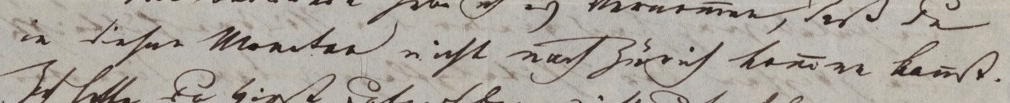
in diesen Monaten nicht nach Zürich kommen kannst.
